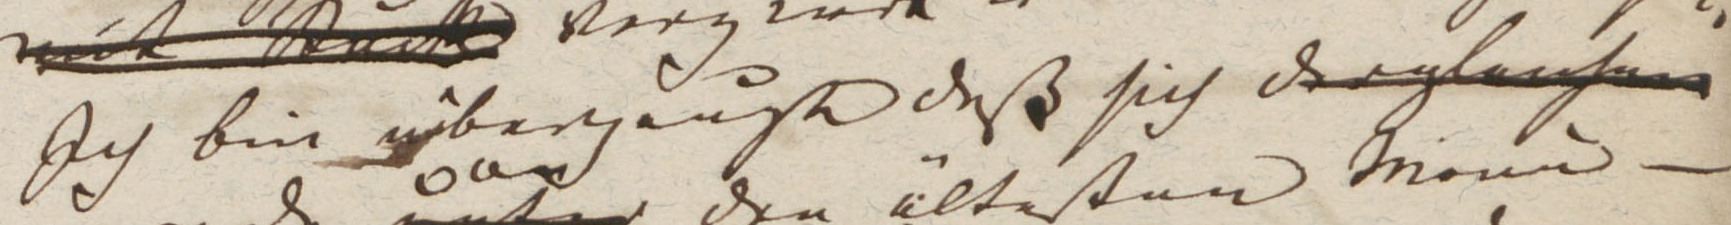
Ich bin überzeugt dass sich dergleichen
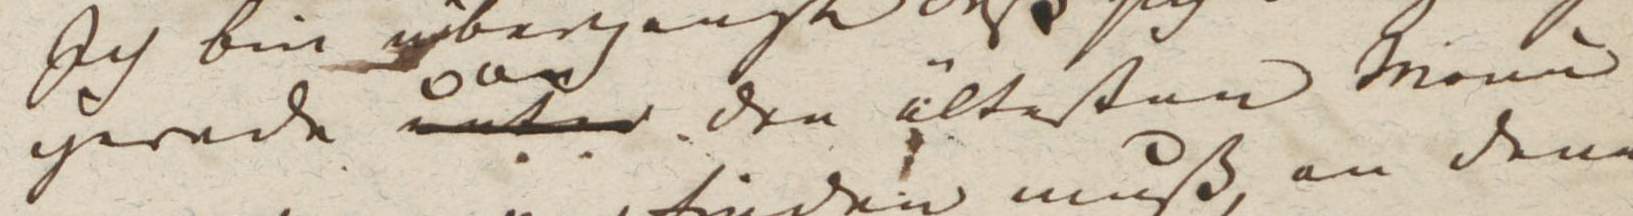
gerade unter an den ältesten Monu-
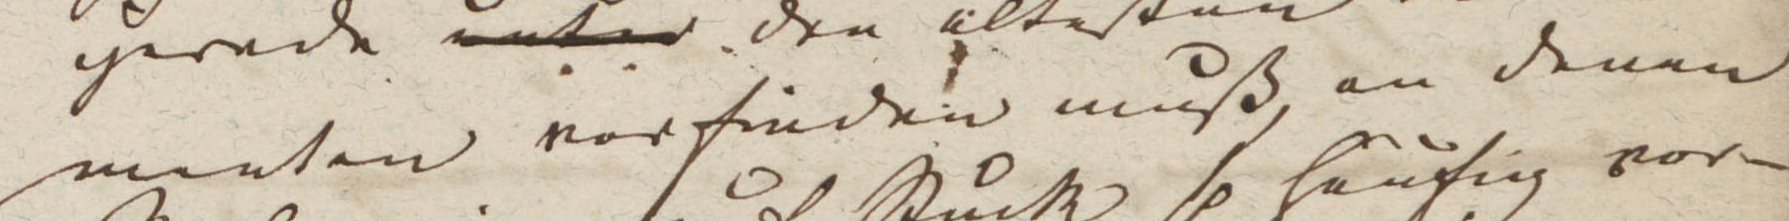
menten vorfinden muss, an denen
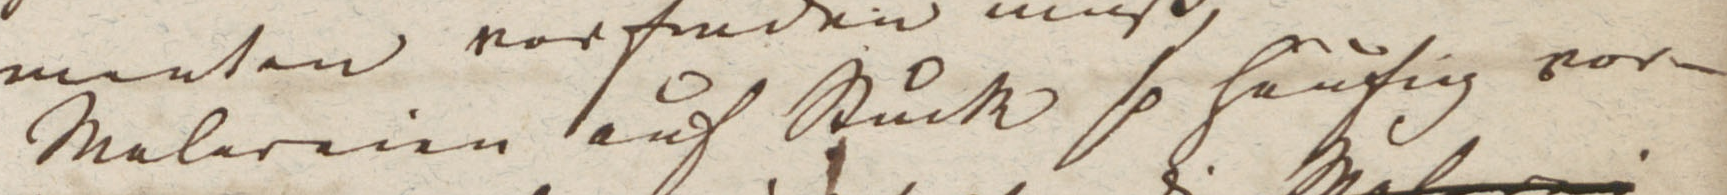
Malereien auf Stuck so häufig vor-
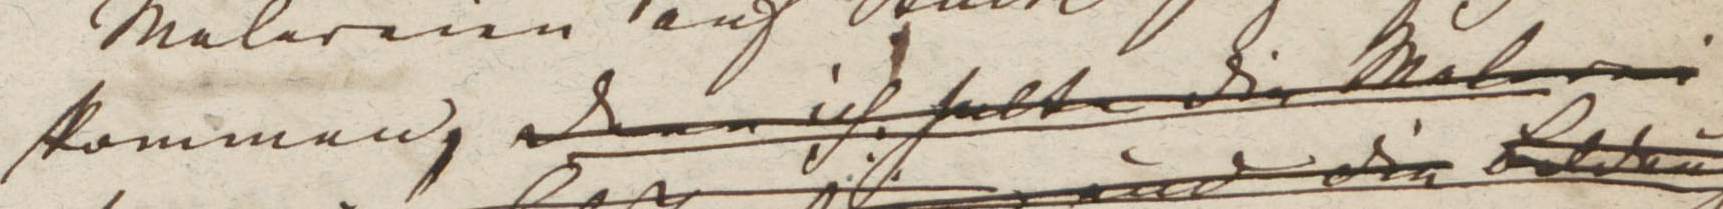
kommen, denn ich sollte die Malerei
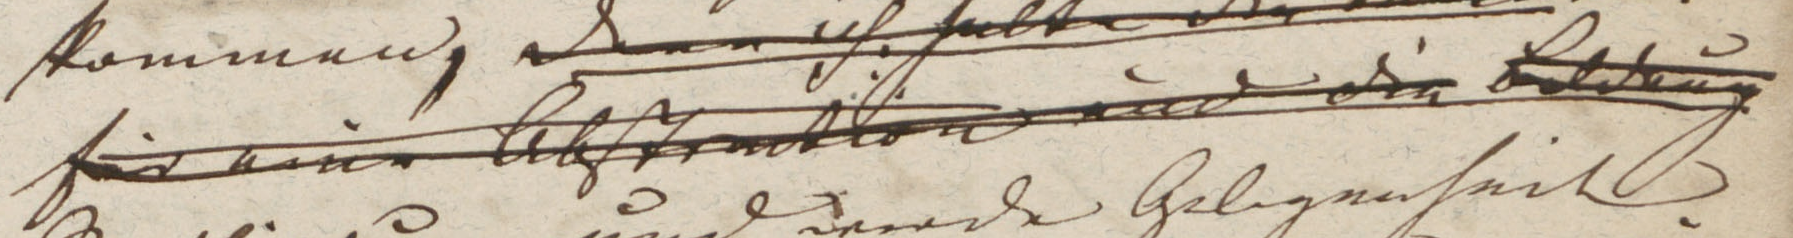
für eine Abstraction und die Bildung
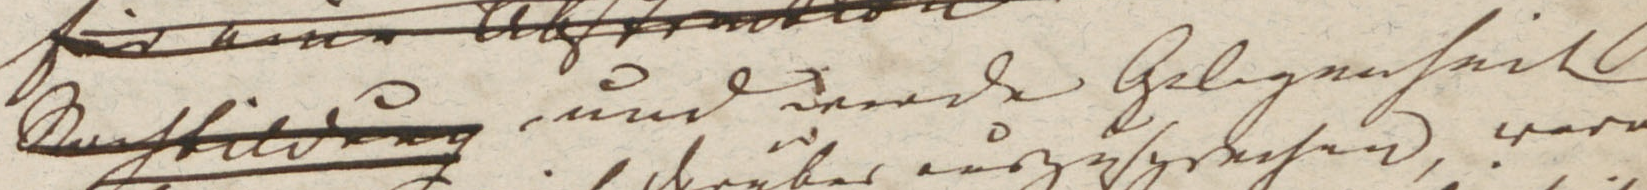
Nachbildung und werde Gelegenheit
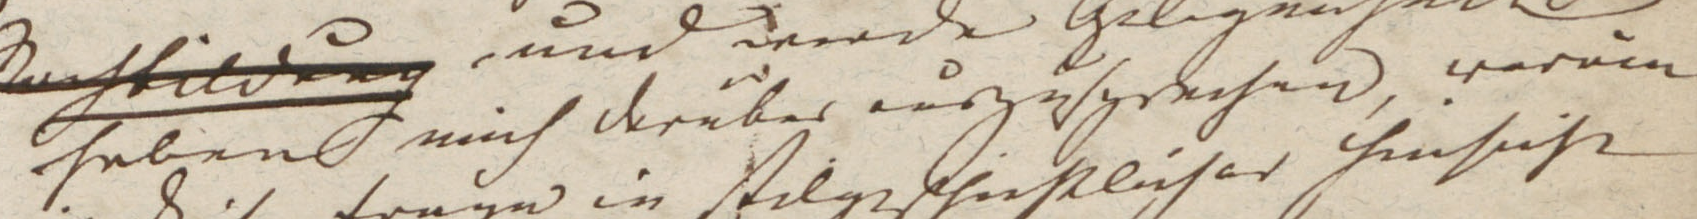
haben mich darüber auszusprechen, warum
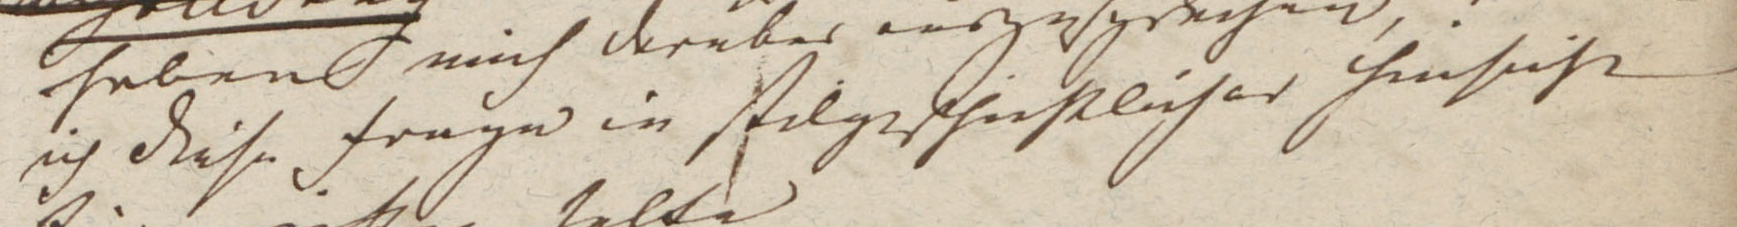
ich diese Fragen in stilgeschichtlicher Hinsicht
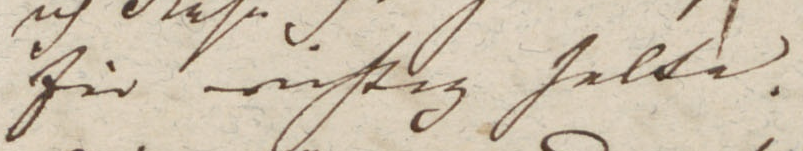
für wichtig halte.
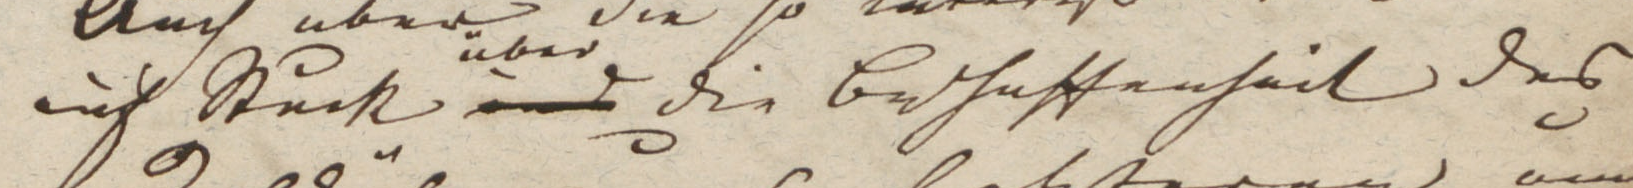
auf Stuck und über die Beschaffenheit des
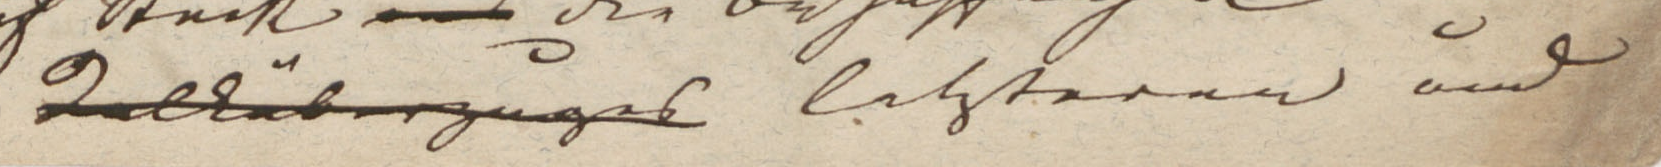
Kalküberzgues letzteren und
